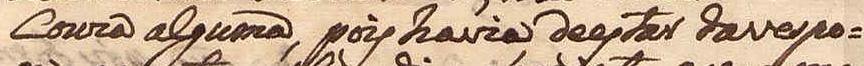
Couza alguma, pois havia de estar da vespe
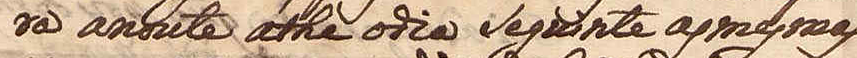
ra a noute athe o dia seguinte as mesmas
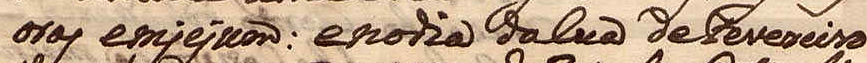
oras em jejum: e no dia da lua de Fevereiro
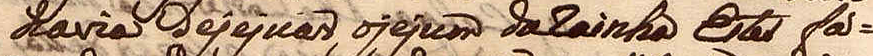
havia de jejuar o jejum da Rainha Ester fa
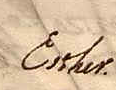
Esther.
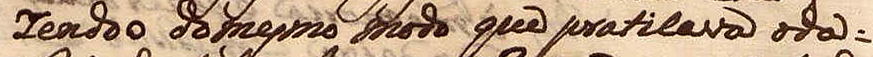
zendoo do mesmo modo que praticava o da
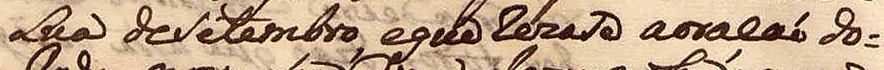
Lua de setembro, e que Rezase a oraçaõ do
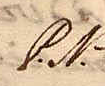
P. N.
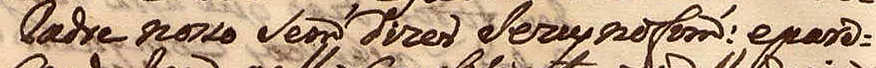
Padre nosso sem dizer Iezus no fim: e pare
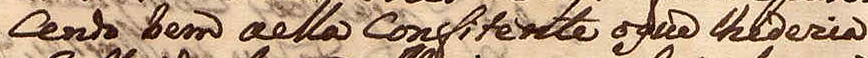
Cendo bem a ella Confitente o que lhe dezia
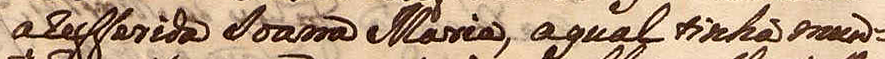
a Refferida Ioana Maria, a qual tinha mun
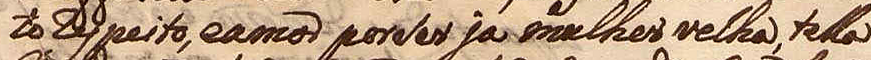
to Respeito, e amor por ser ja mulher velha, tella
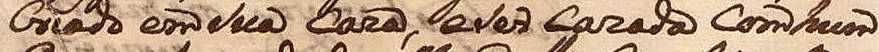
Criado em sua Caza, e ser cazada com hum
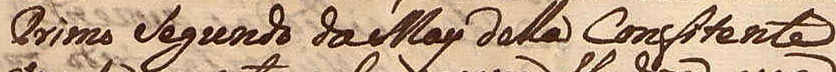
Primo segundo da May della Confitente
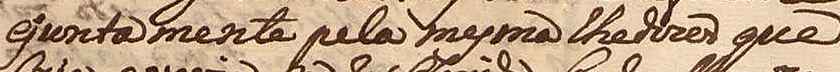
e juntamente pela mesma lhe dizer que
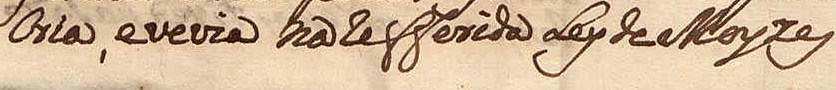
Cria, e vevia na Refferida Ley de Moyzes
